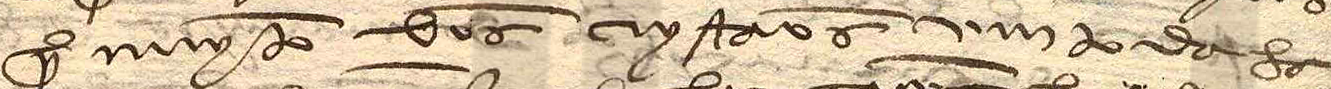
p̄o muyto bōs crystãos em toda ha
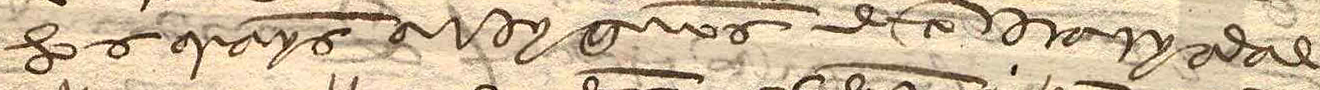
hos quays artyguos de c̄otraryadade
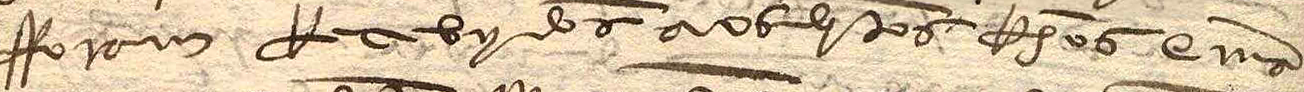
fforam Recebydos aos djtos Rꝭos e mā
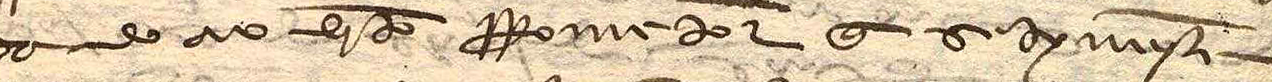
dado ao djto ꝓꝓmetor q̄ se tyuese
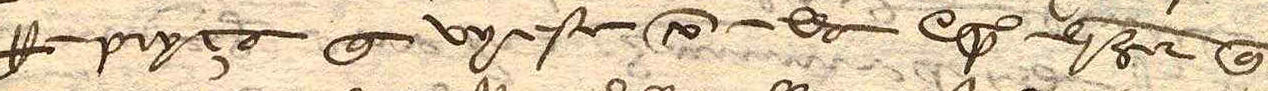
Repryça q̄ vyese c̄o ella e p̄o djzer q̄
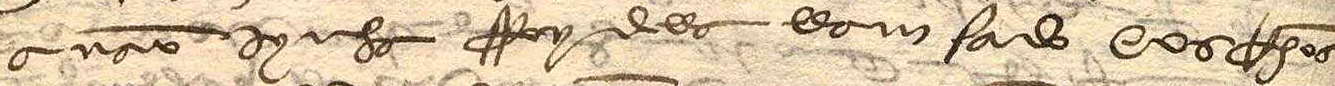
a não tynha ffoy della llamsado e os Rꝭos
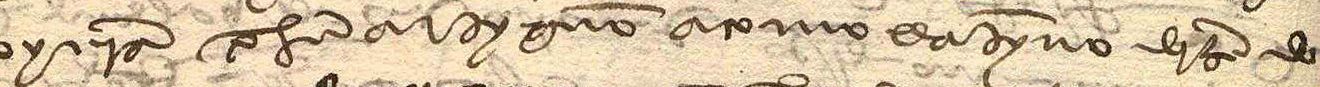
vyerā cō hū artyguo acomollatyuo djzēdo
